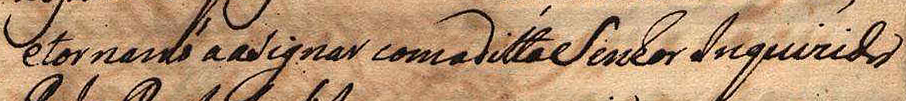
e tornaraõ a asignar com o ditto Senhor Inquizidor
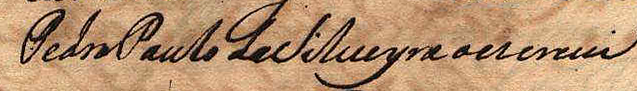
Pedro Paulo da Silueyra o escreui
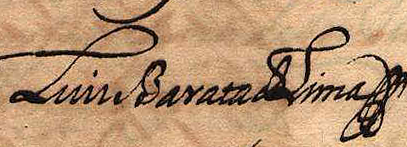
Luiz Barata de Lima
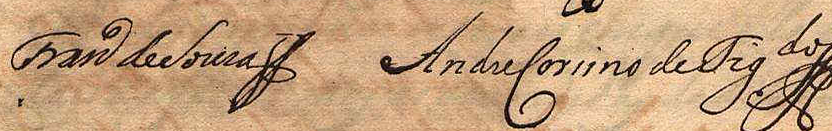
Fran.co de Souza Andre Corsino de Figdo
